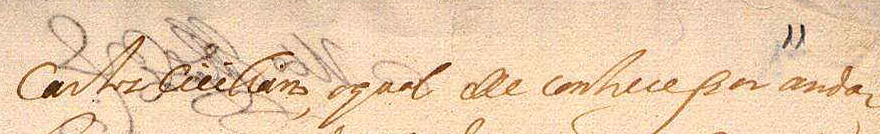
carlos ciciliano, o qual elle conhece por andar
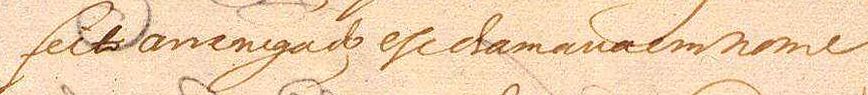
feito arrenegado e se chamaua em nome
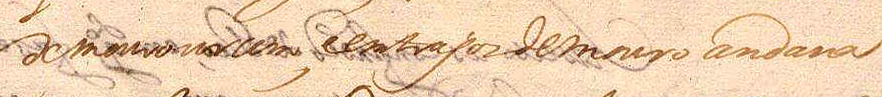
de mouro urcem, e em trajos de mouro andaua
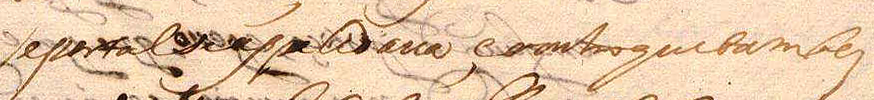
e por tal se appelidaua, e o outro que tambē
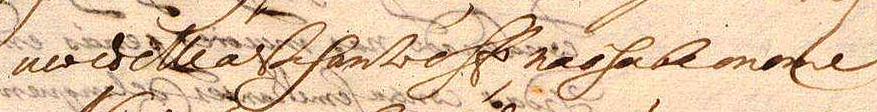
ueo cō elle a este santo offo naõ sabe o nome
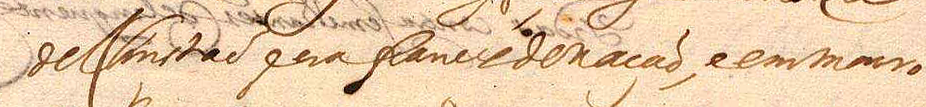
de Christaõ e era frances de naçaõ, e em mouro
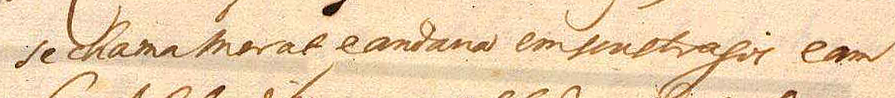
se chama morat e andaua em seus trajos e am
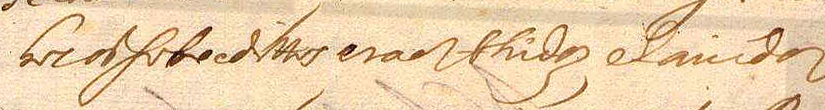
bos os sobredittos eraõ thidos e hauidos
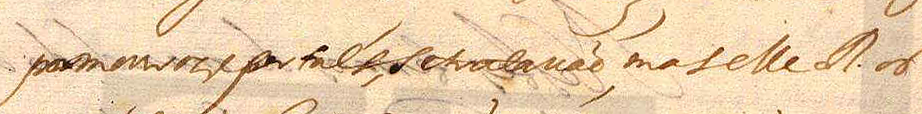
por mouros e por taes se tratauaõ mas elle R. os
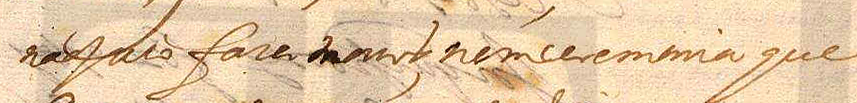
naõ uio fazer autos, nem ceremonia que
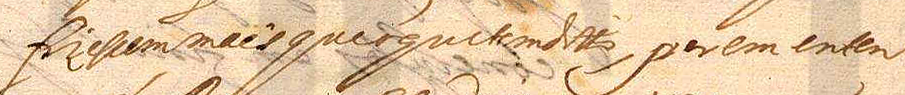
fizessem mais que o que tem ditto, porem enten
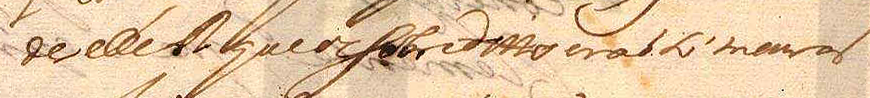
de elle R que os sobredittos eraõ só mouros
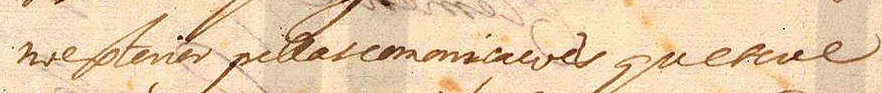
no exterior pellas comonicaçoẽs que teue
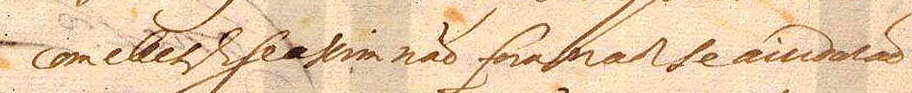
com elles E se assim naõ fora naõ se aiudaraõ
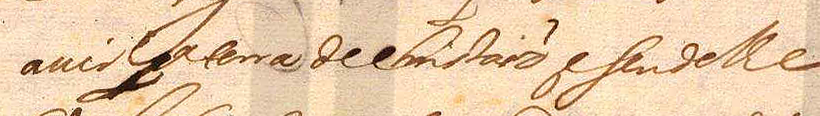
a uir pa terra de christaõs, e sendolhe
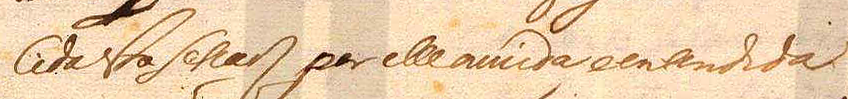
lida esta sessaõ por elle ouuida e entendida
